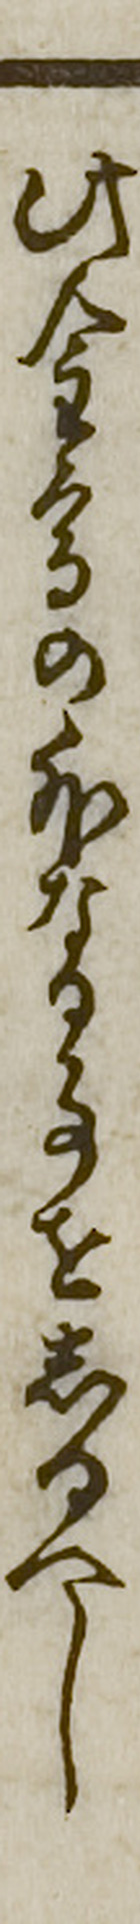此金高の外なる事をしるへし
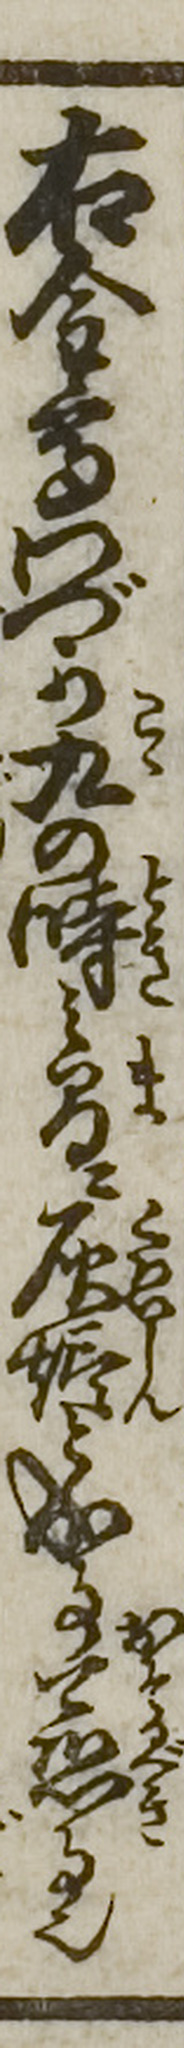右金高わづか九の時之間に灰燼と成事可恐事也
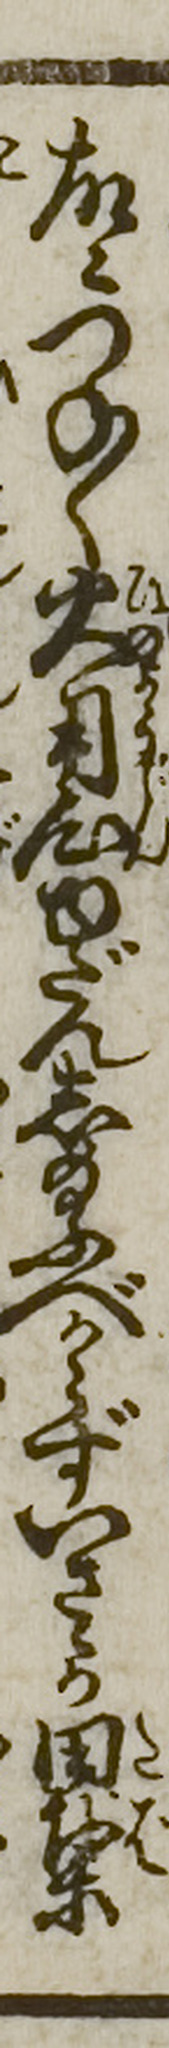故につね〳〵火用心ゆだんし給ふべからずいさゝか田葉
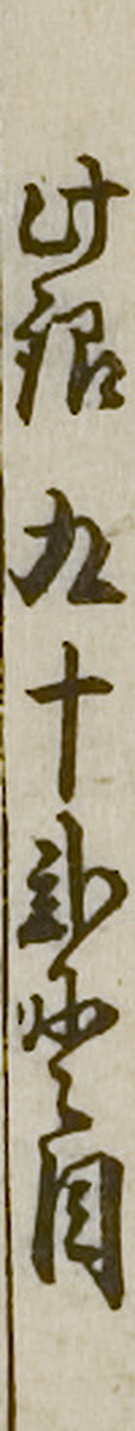此銀九十弐貫目
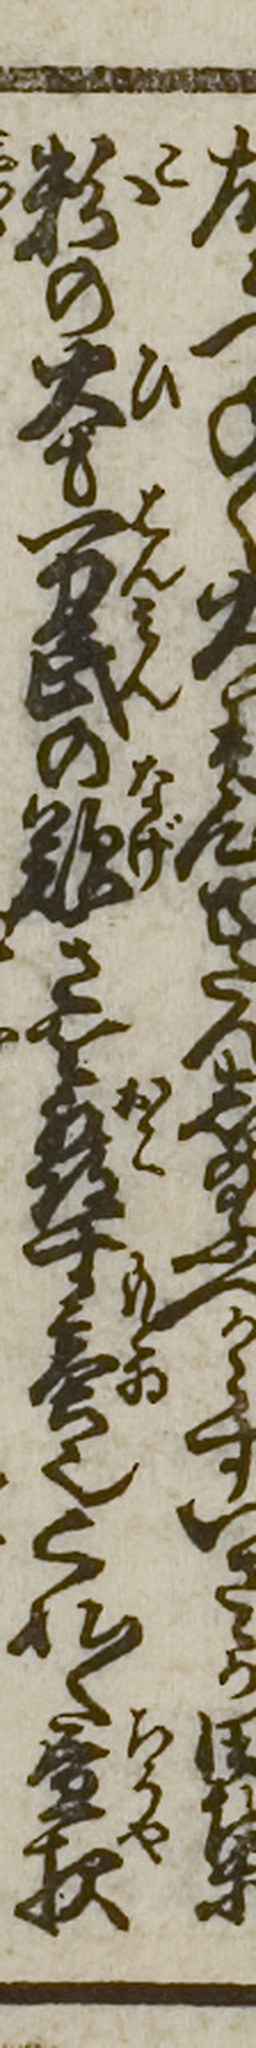粉の火も万民の歎きを発す基也くれ〳〵昼夜
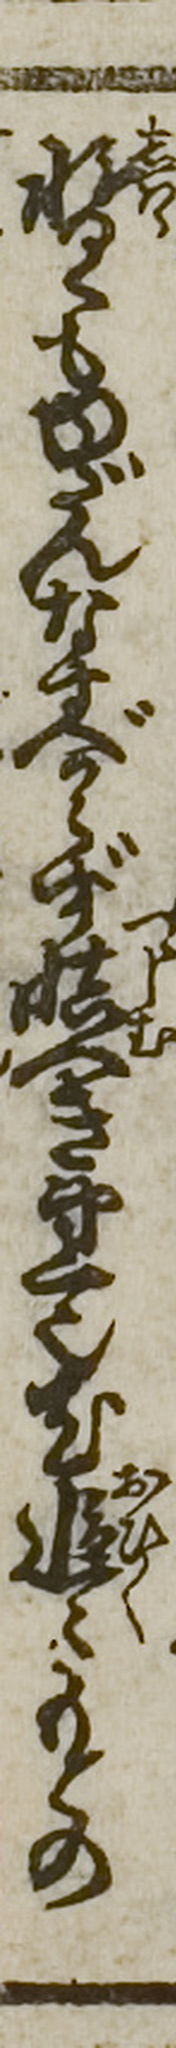暫くもゆだんなすべからず慎へき第一也尤追々もとの
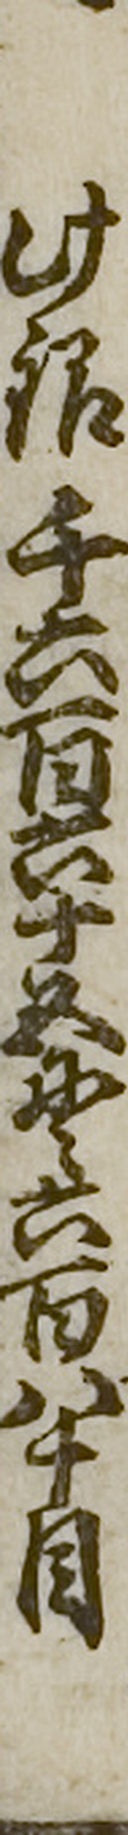此銀千六百六十五貫六百八十目
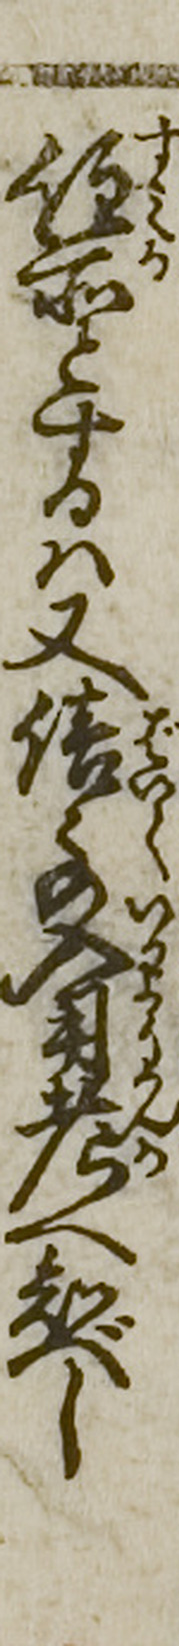住所とするは又倍々の入用考へ知べし
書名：上京火災町家雑具損亡考記
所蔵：東京大学総合図書館 General Library in the University of Tokyo, JAPAN
